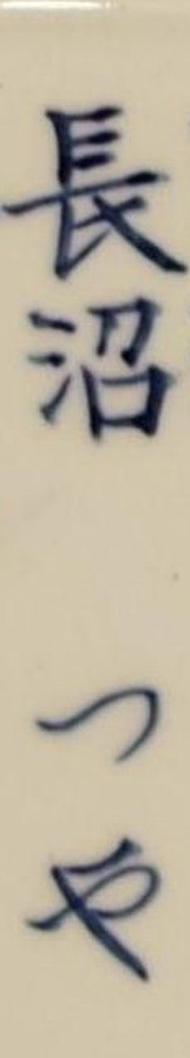長沼つや
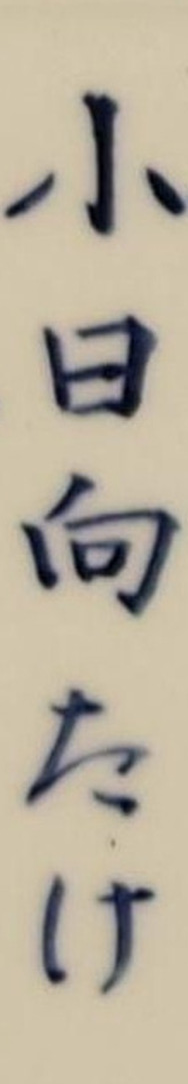小日向たけ
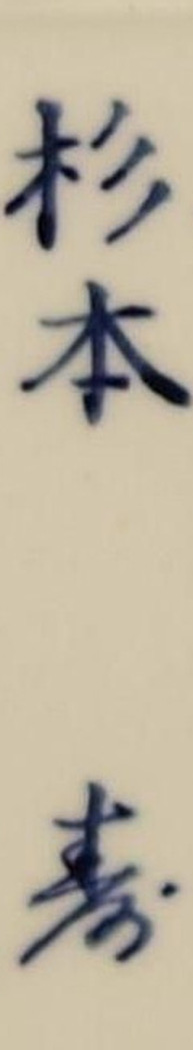杉本寿
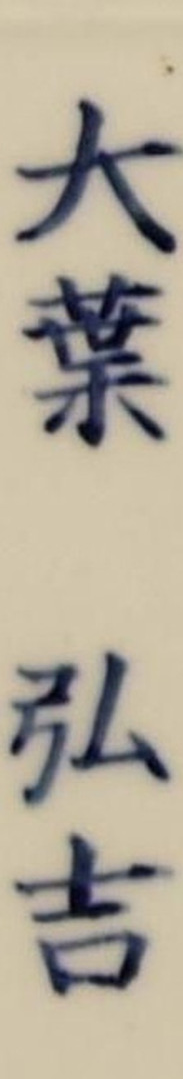大葉弘吉
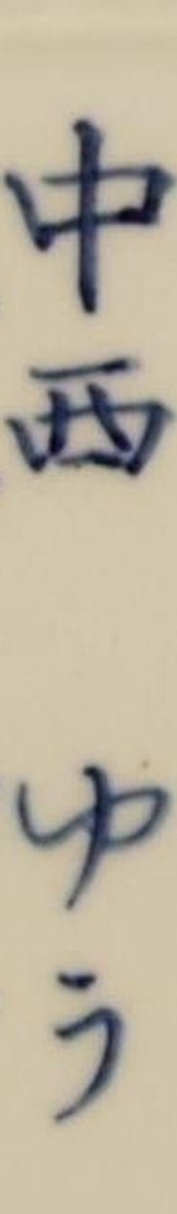中西ゆう
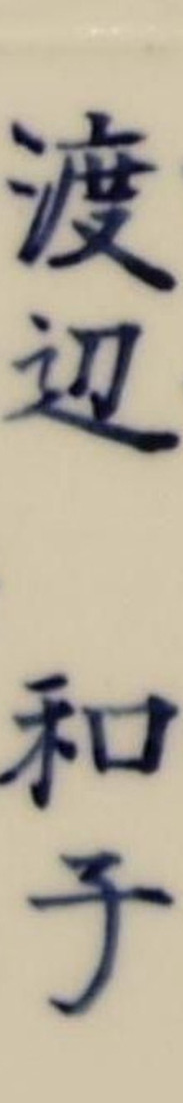渡辺和子
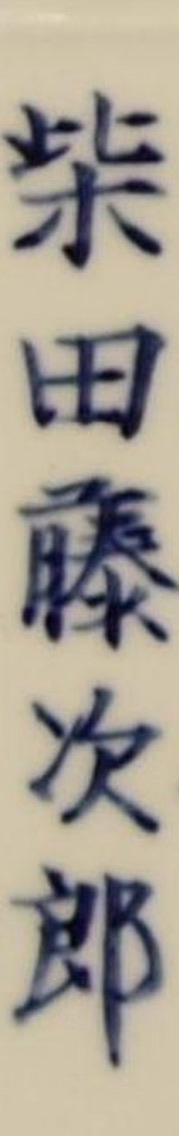柴田藤次郎
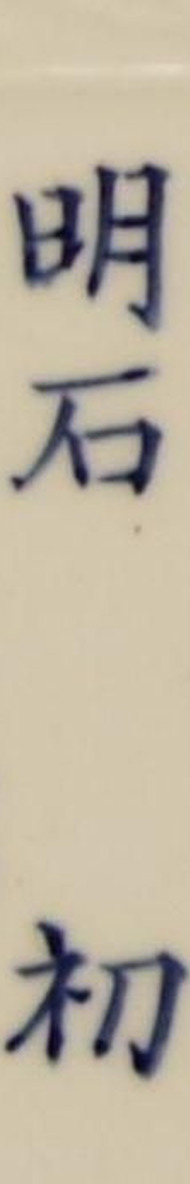明石初
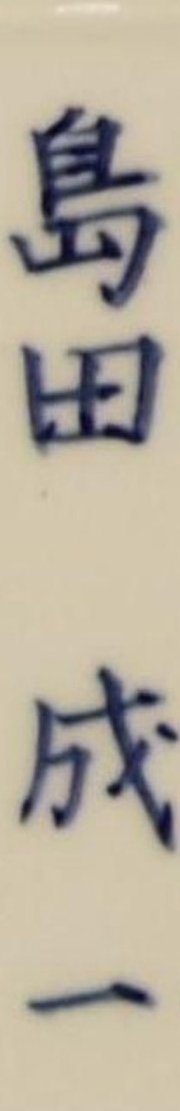島田成一
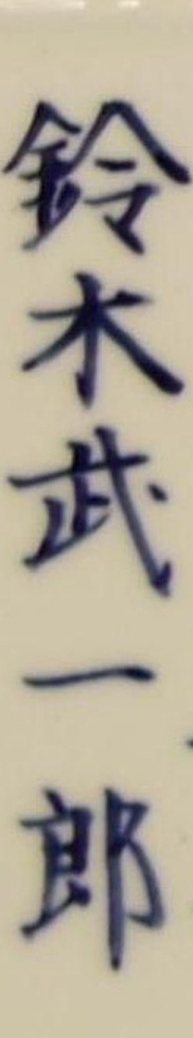鈴木武一郎

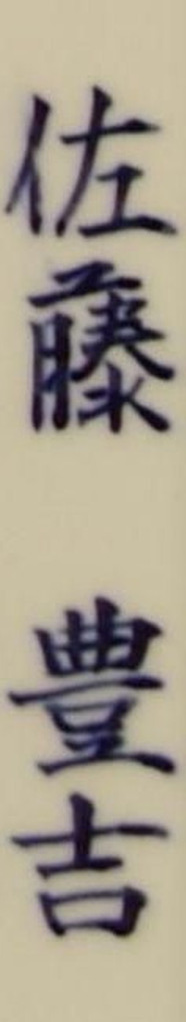佐藤豊吉
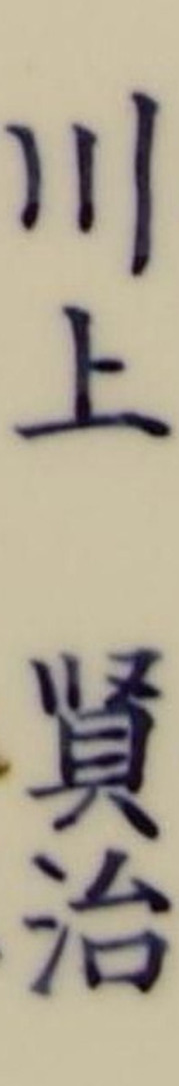川上賢治
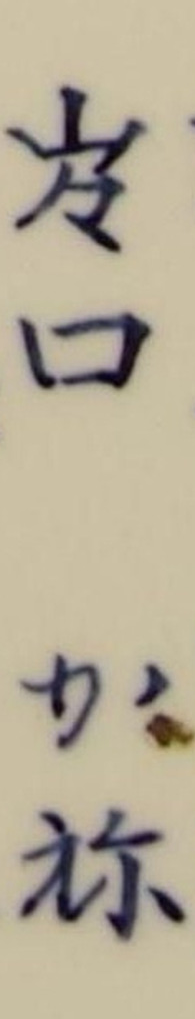出口かね
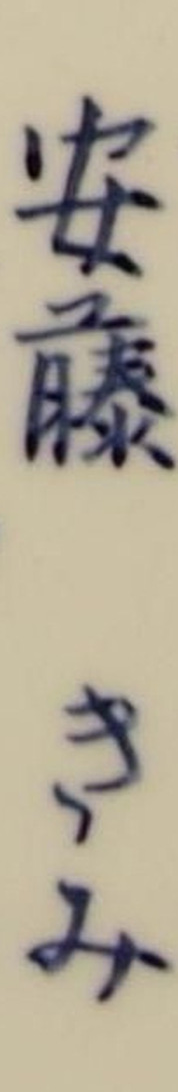安藤きみ
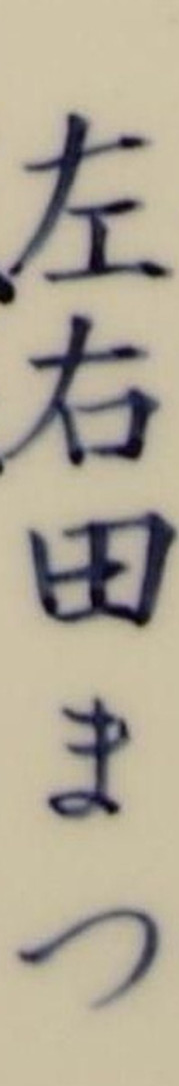左右田まつ
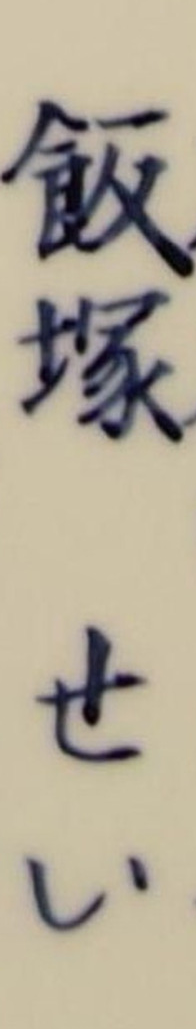飯塚せい
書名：A~D
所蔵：koyasan kongobuji
